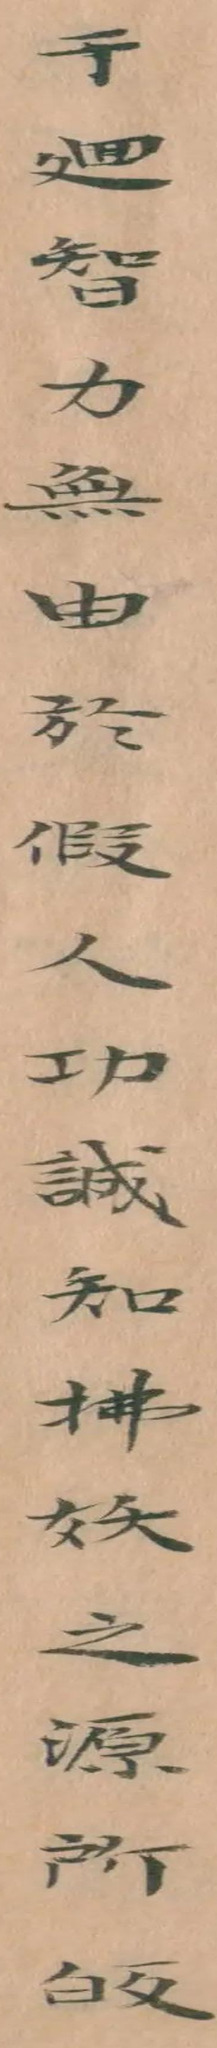于廻智力無由於仮人功誠知払妖之源所帰

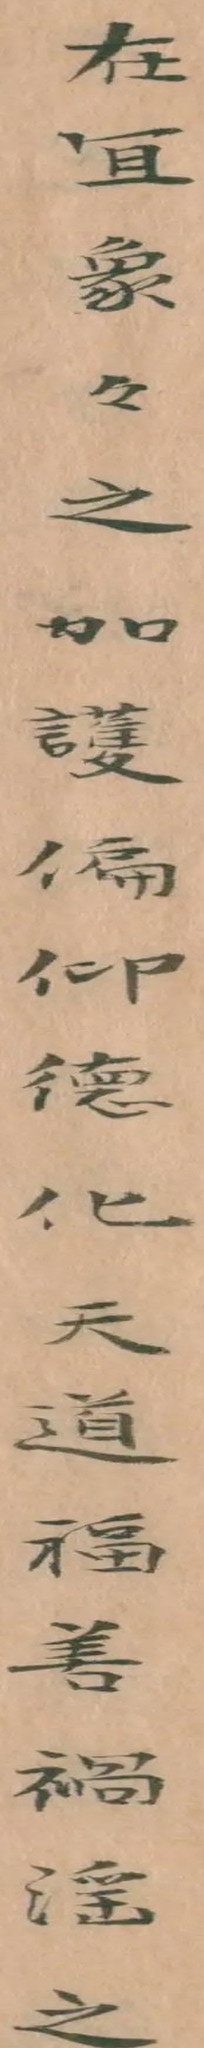在宜象々之加護偏仰徳化天道福善禍之
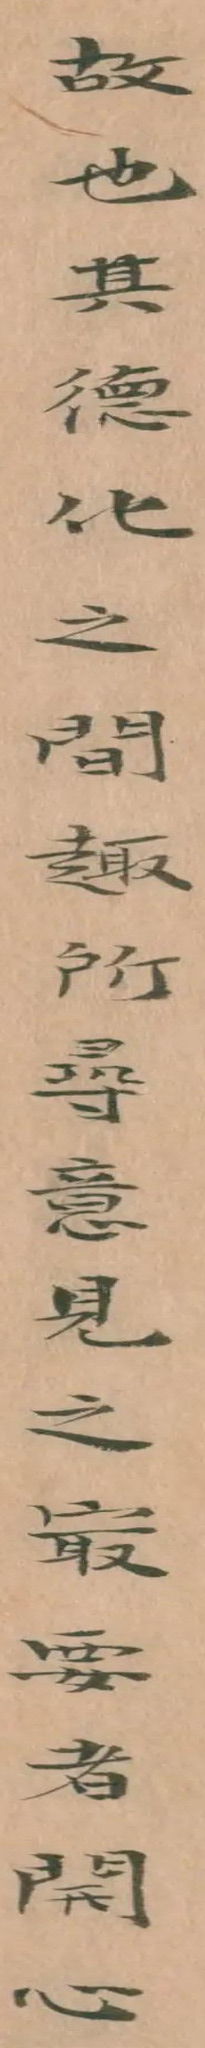故也其徳化之間趣所尋意見之最要者開心
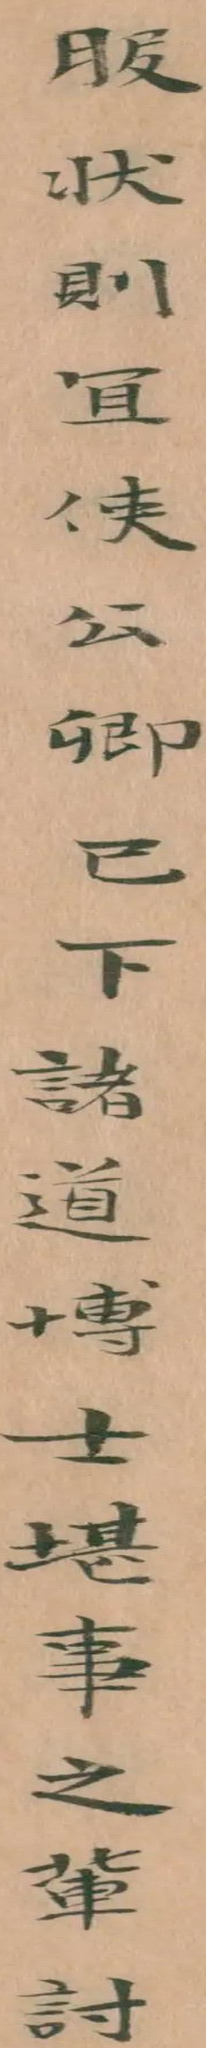服状則宜使公卿已下諸道博士堪事之輩討
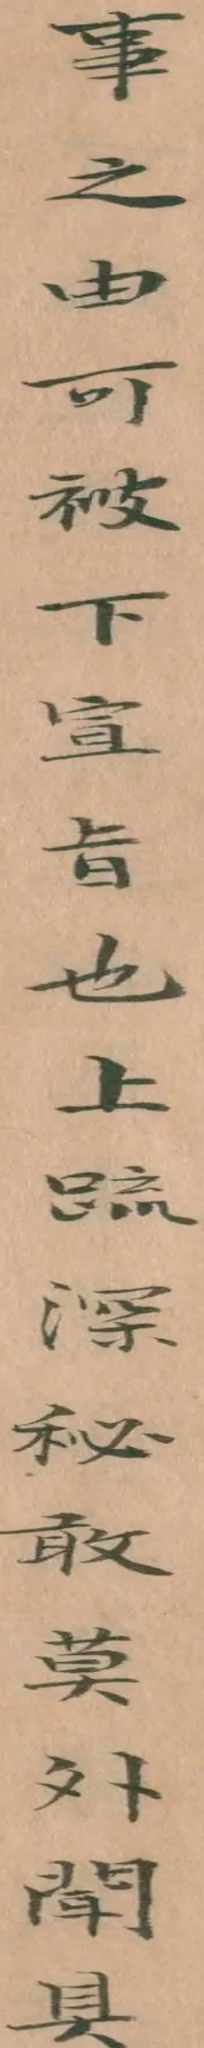事之由可被下宣旨也上䟽深秘敢莫外聞具
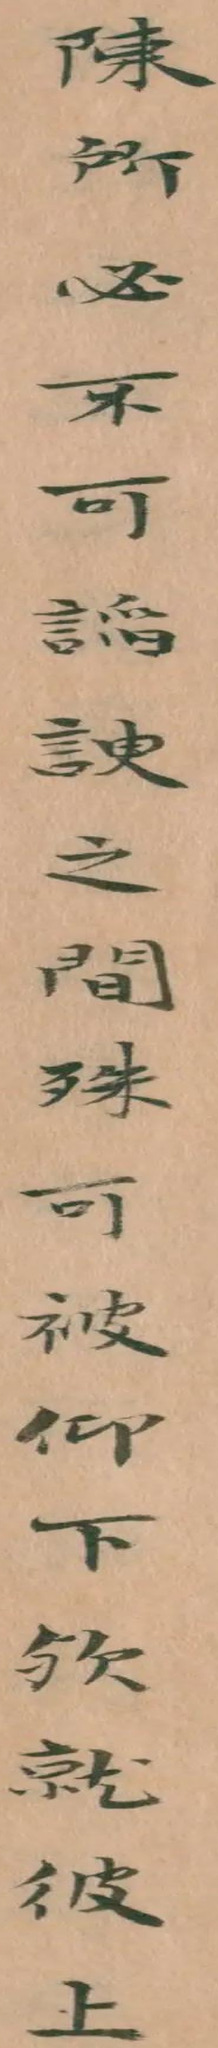陳所必不可諂諛之間殊可被仰下歟就彼上
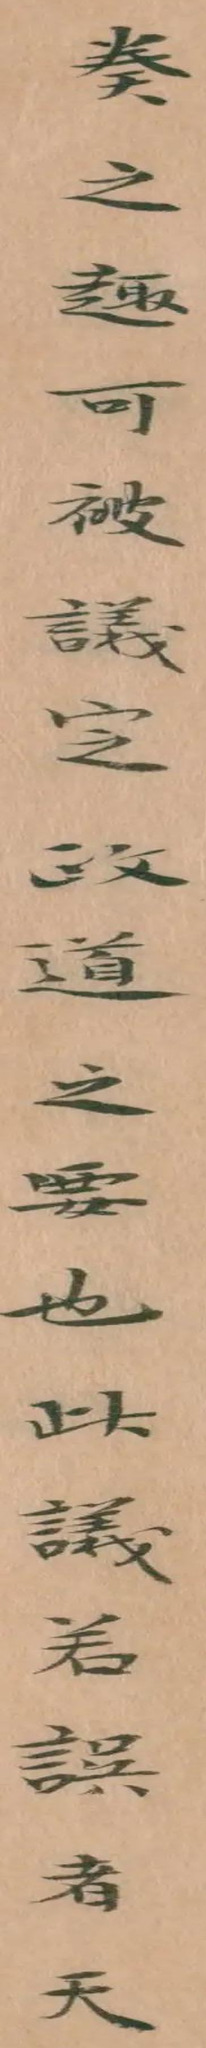奏之趣可被議定政道之要也此議若誤者天
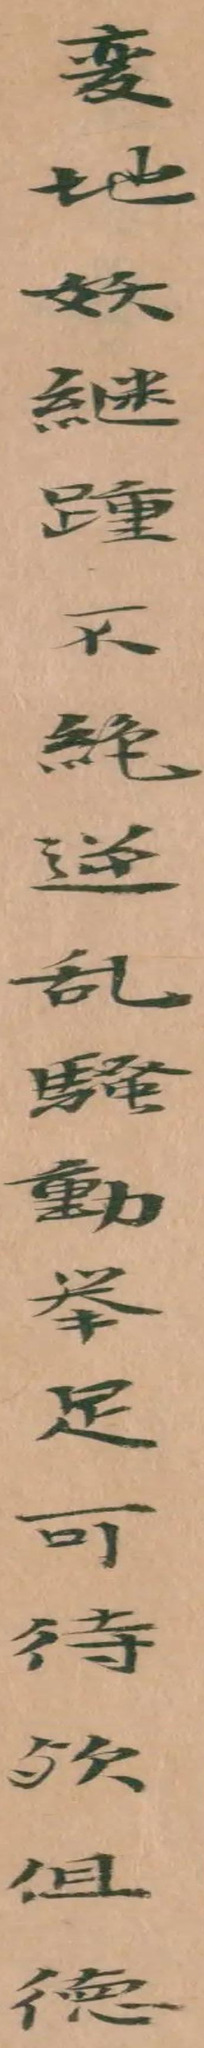変地妖継踵不絶逆乱騒動挙足可待歟但徳
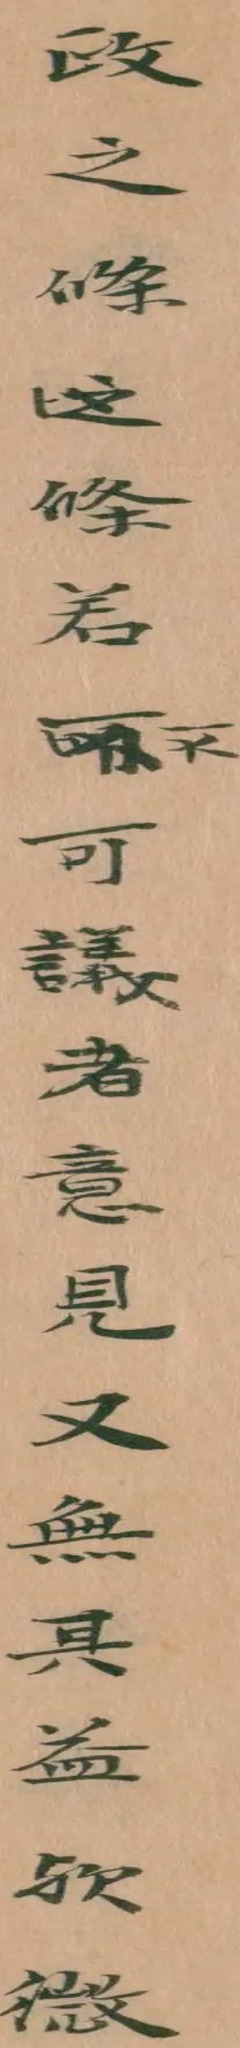政之条条若不可議者意見又無其益歟微
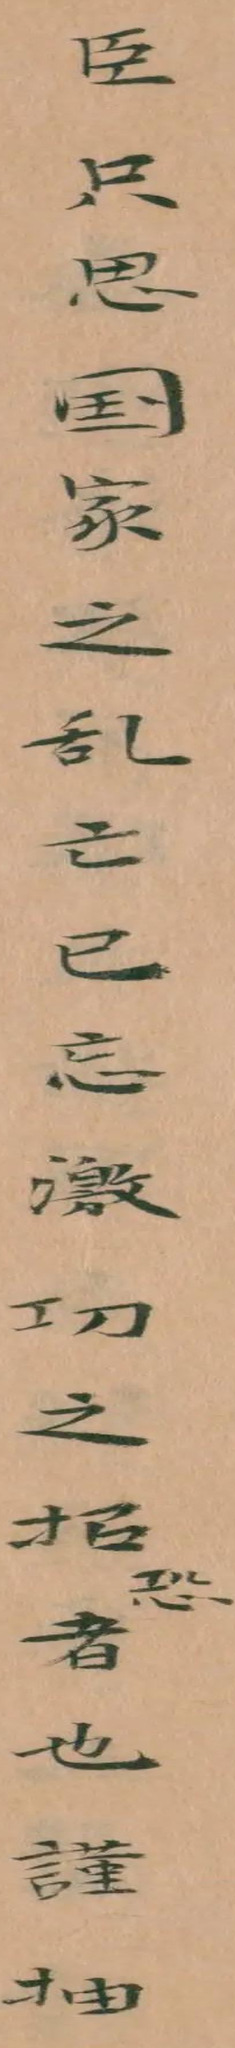臣只思国家之乱亡已忘激功之招恐者也謹抽
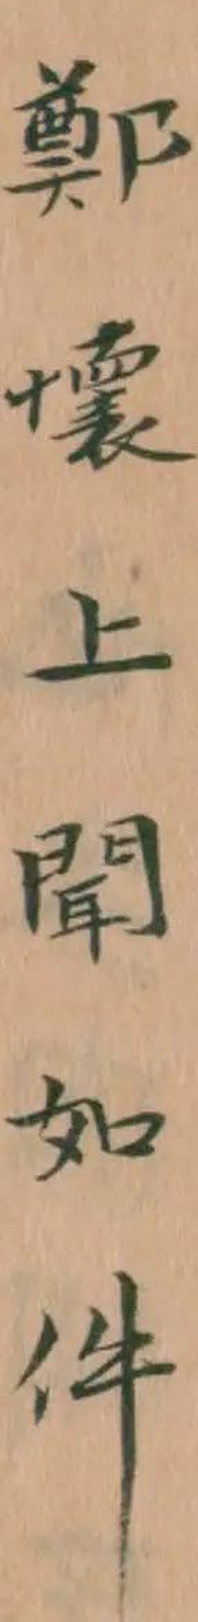鄭壊上聞如件
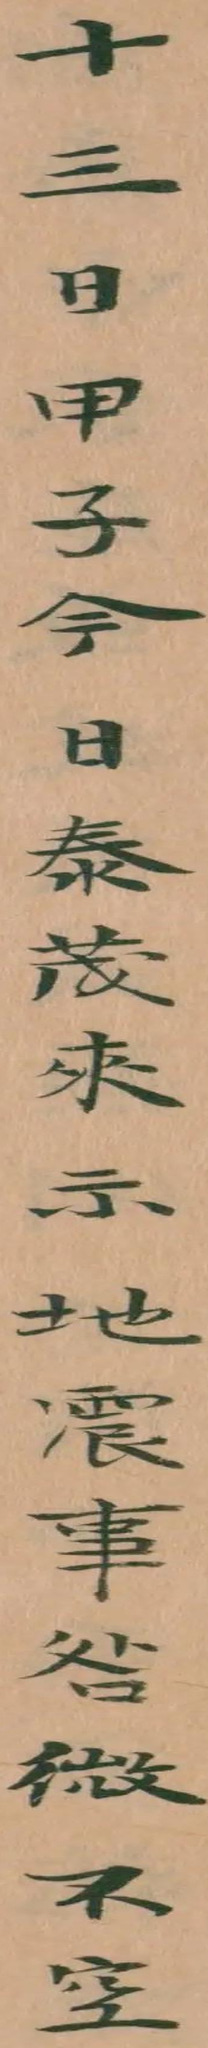十三日甲子今日泰茂来示地震事咎微不空
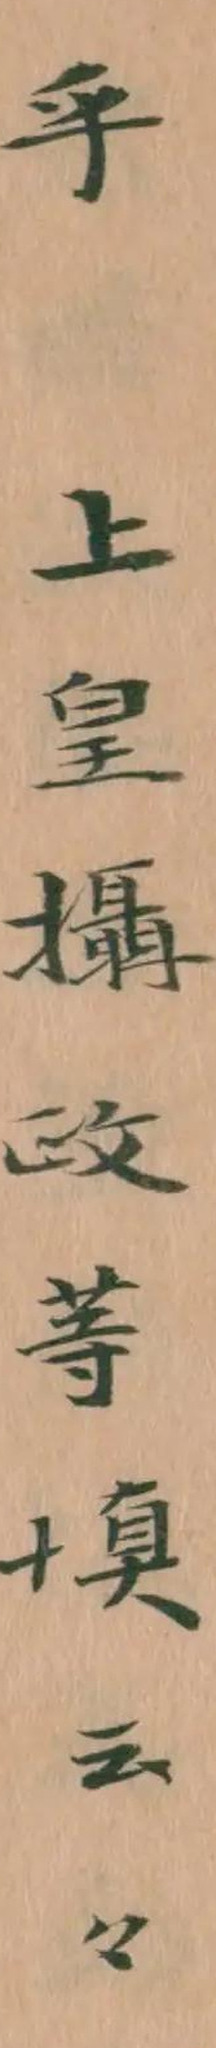乎上皇摂政等填云々
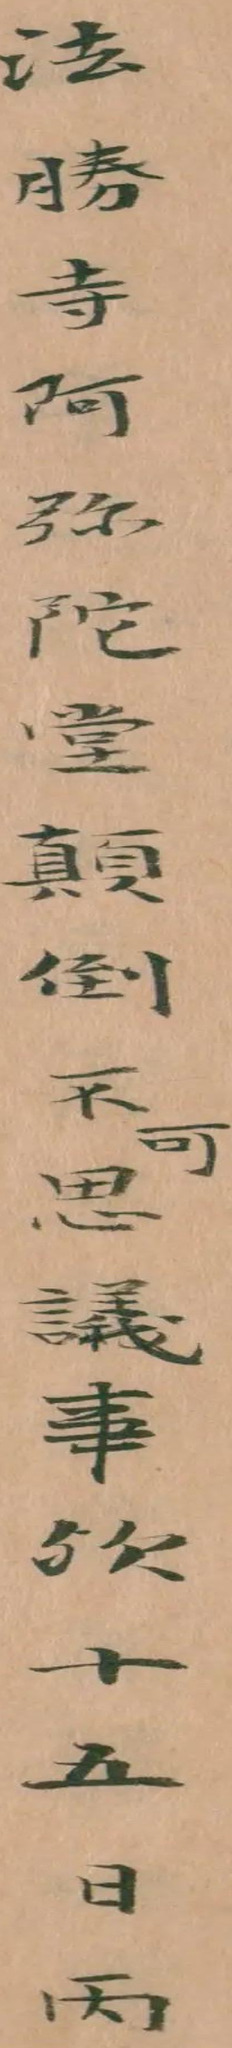法勝寺阿弥陀堂顛倒不可思議事歟十五日丙
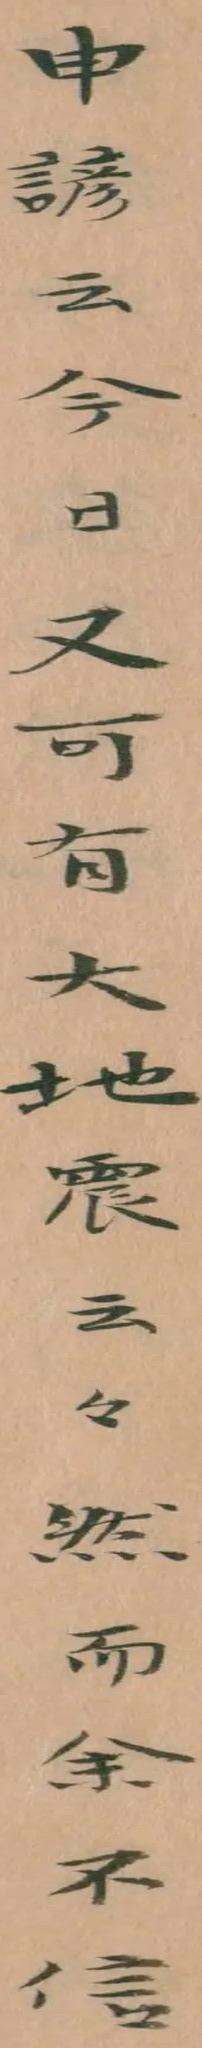申諺云今日又可有大地震云々然而余不信
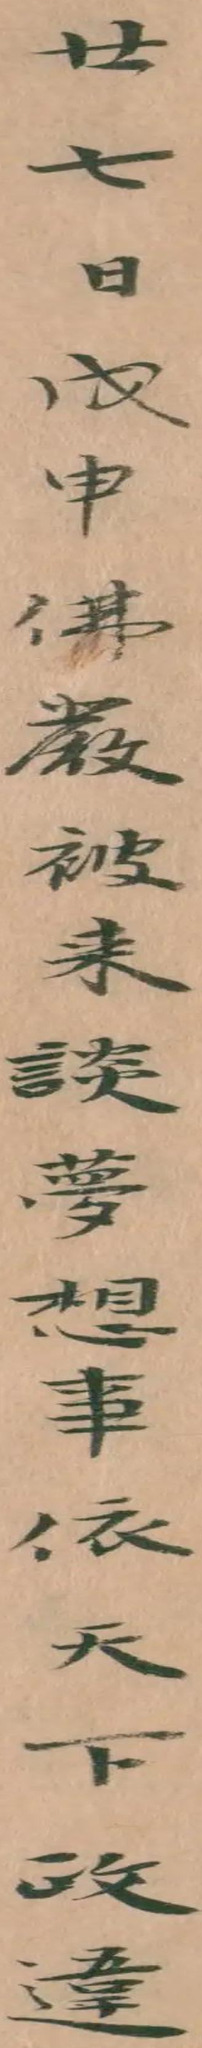廿七日戊申仏厳被来談夢想事依天下政違
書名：地災撮要. 巻5-6(地震之部)
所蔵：国立国会図書館 National Diet Library, JAPAN
